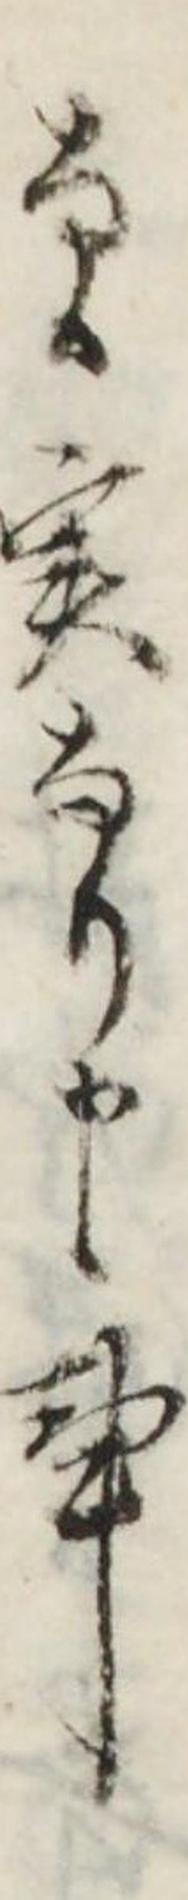なる実なり申候事
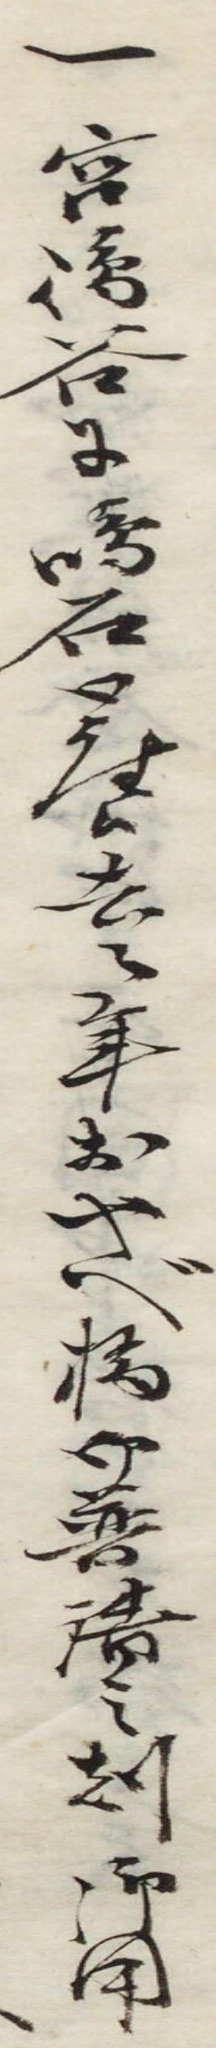一宮僧谷に鳴石御座候去々年おやべ橋御普請之刻御用
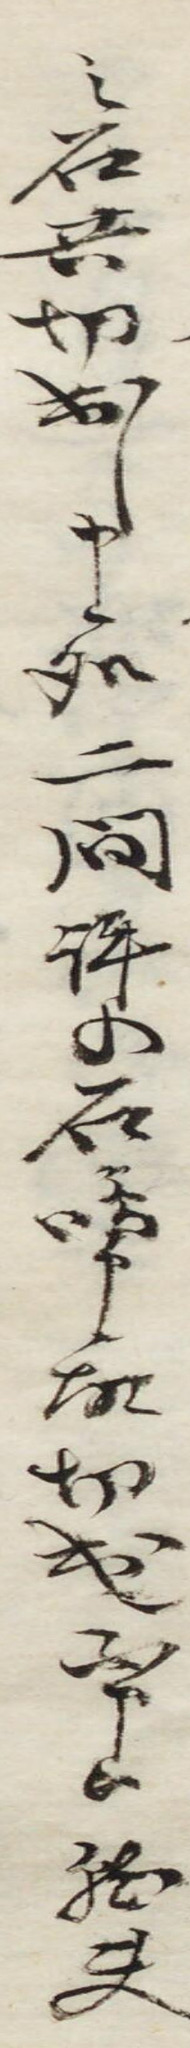之石共切出し申候処二間許石鳴申候故切出し不申候就夫
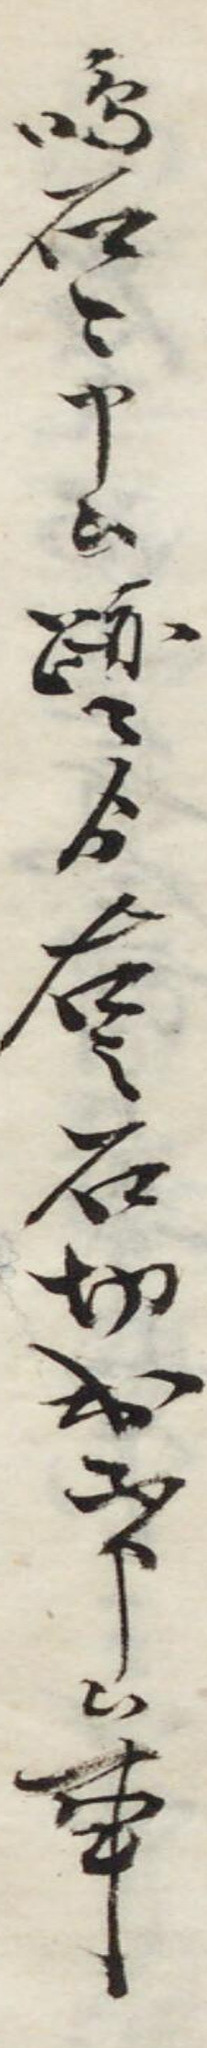鳴石と申候跡々ゟ右之石切出申候事
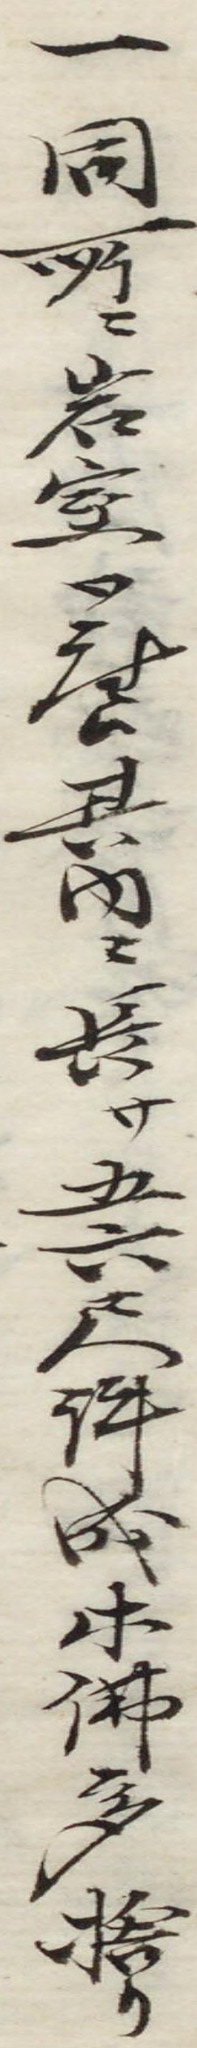一同所に岩室御座候其内に長さ五六尺許成木仏多捨り
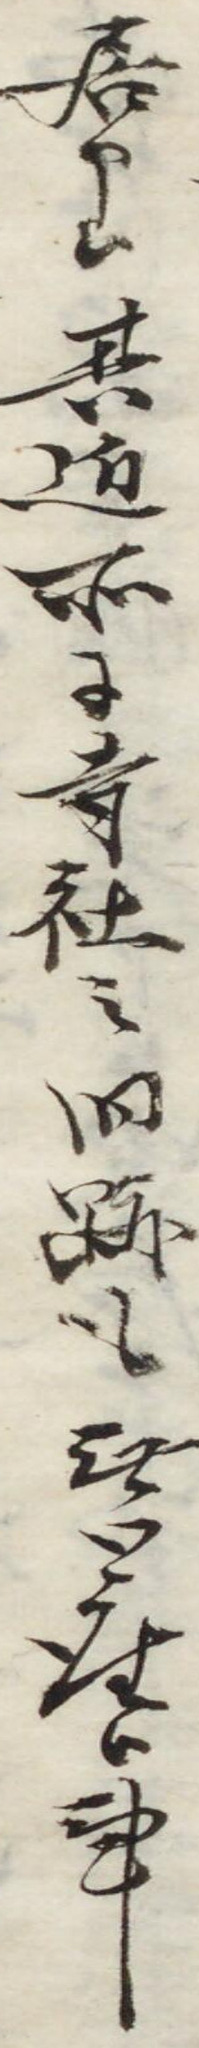居申候其近所に寺社之旧跡も無御座候事
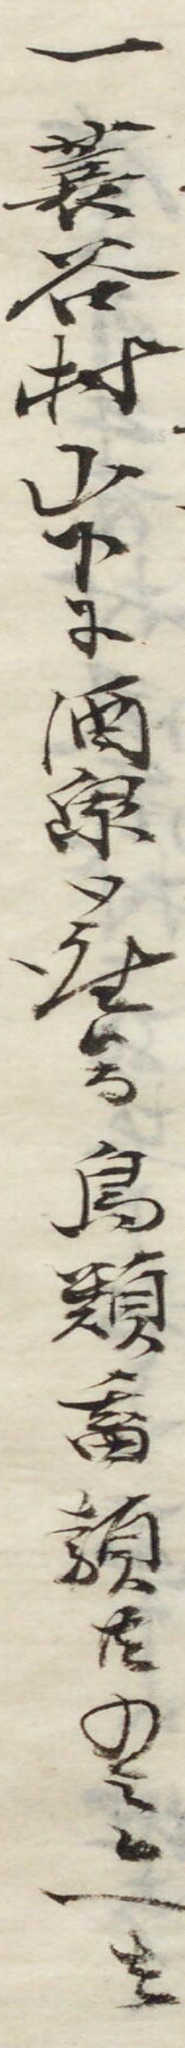一蓑谷村山下に酒和泉御座候而鳥類畜類共のみ候へは
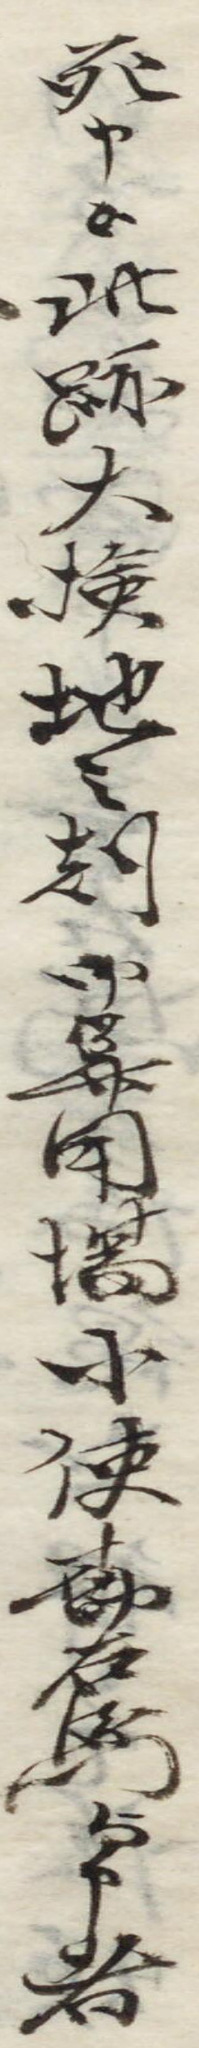死申候此跡大検地の刻御算用場小使勘右衛門与申者
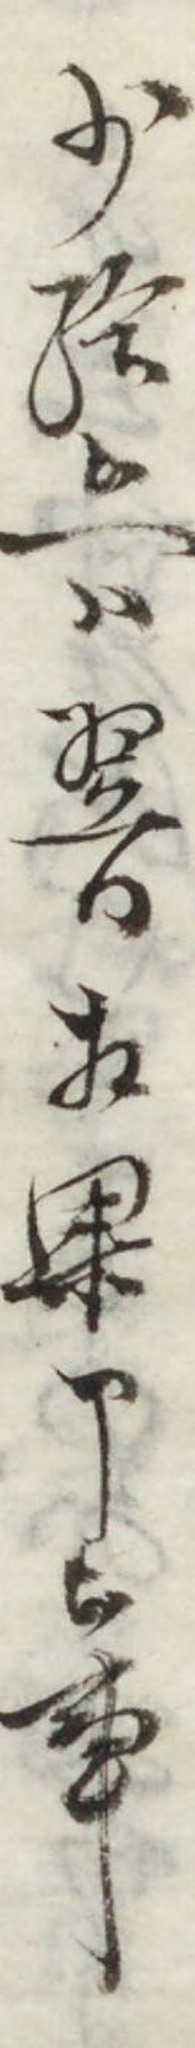少給候へは翌日相果申候事
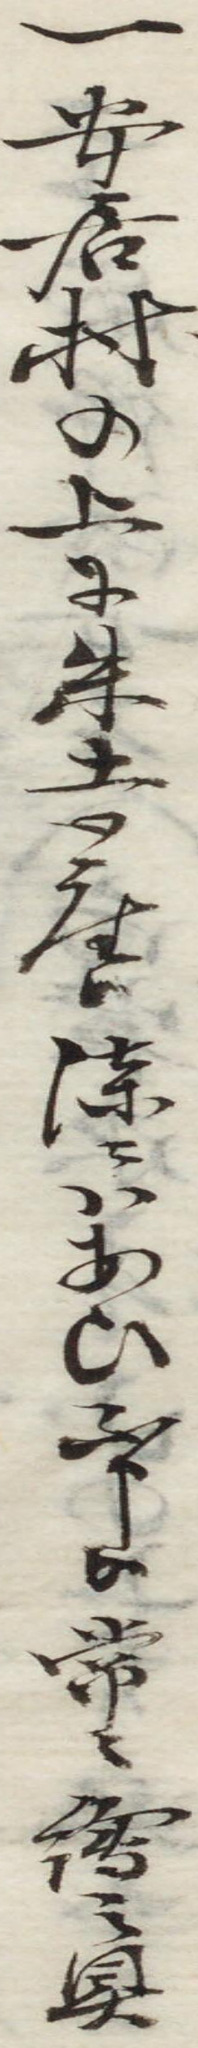一安居村の上に朱土御座候漆にはあひ不申候常々絵之具
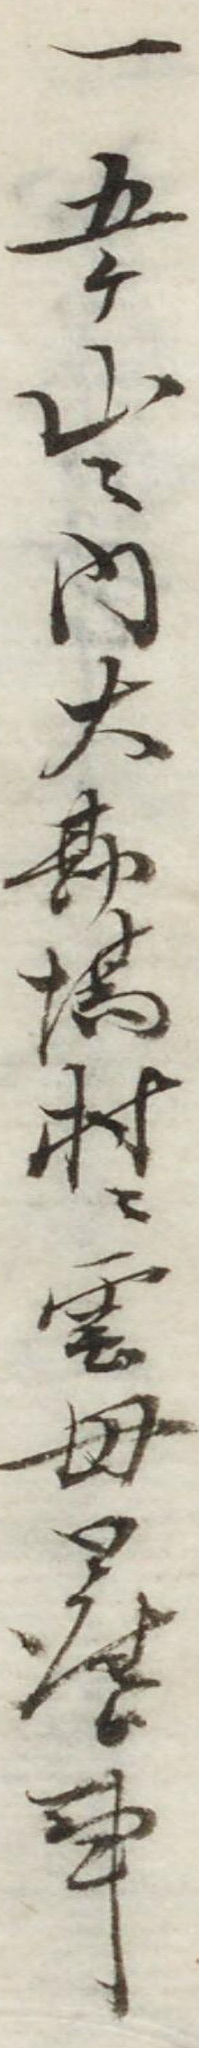一五ヶ山之内大勘場村に雲母御座候事
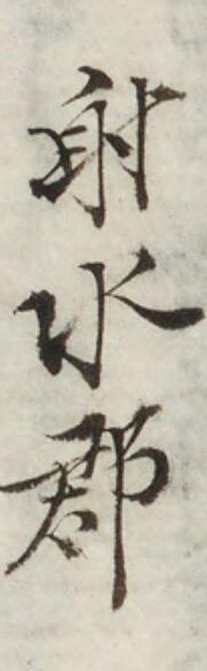射水郡
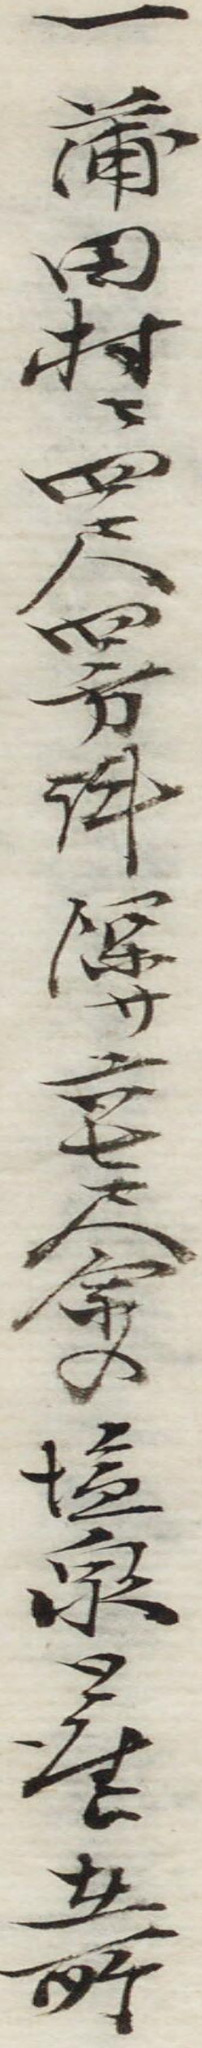一蒲田村に四尺四方許深さ六七尺余の塩泉御座候在所
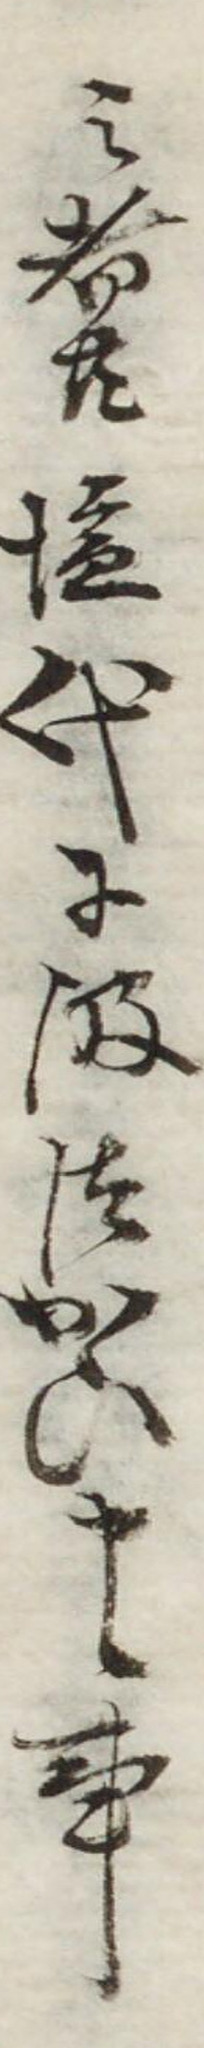之者共塩代に汲つかい申候事
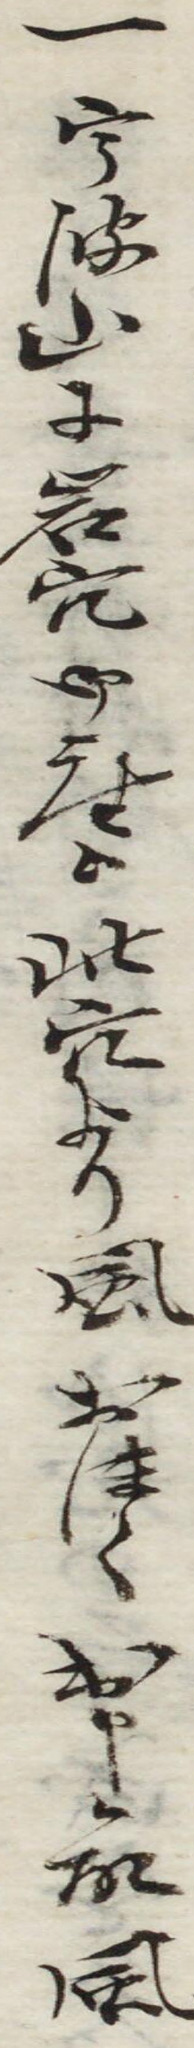一宇波山に岩穴御座候此穴より風おほく出申候故風
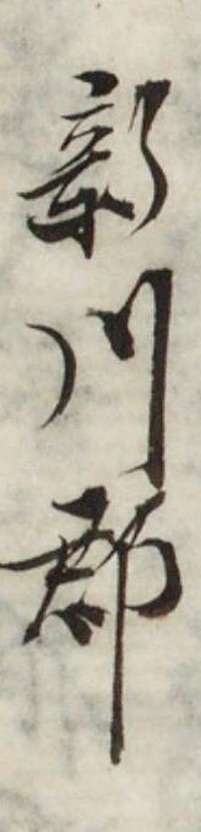新川郡
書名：古老旧聞紀略
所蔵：Ishikawa Prefectural Library
